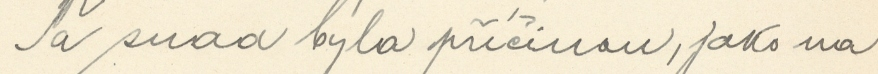Ta snad byla příčinou, jako na
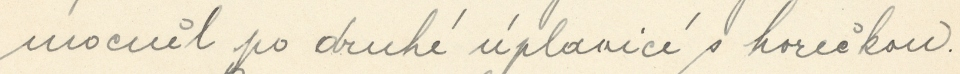mocněl po druhé úplavicí s horečkou.
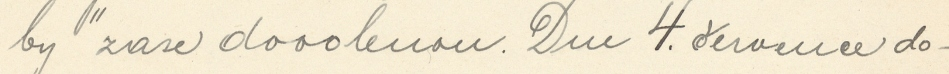by“ zase dovolenou. Dne 4. července do-
